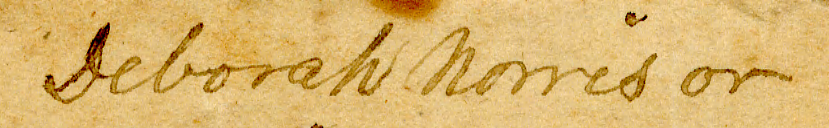Deborah Norris or
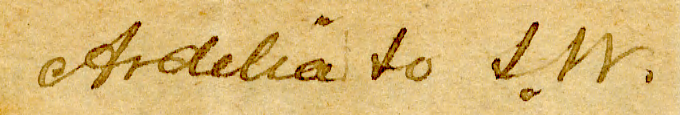Ardelia to S.W.
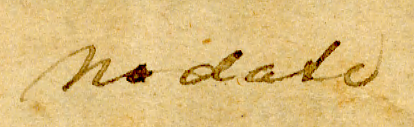no date
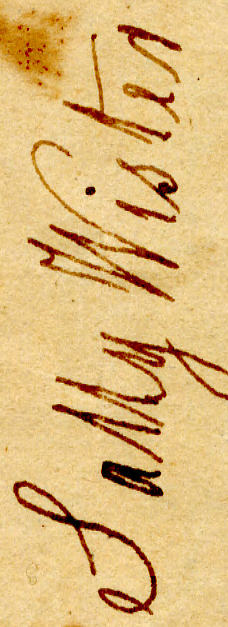Sally Wister
